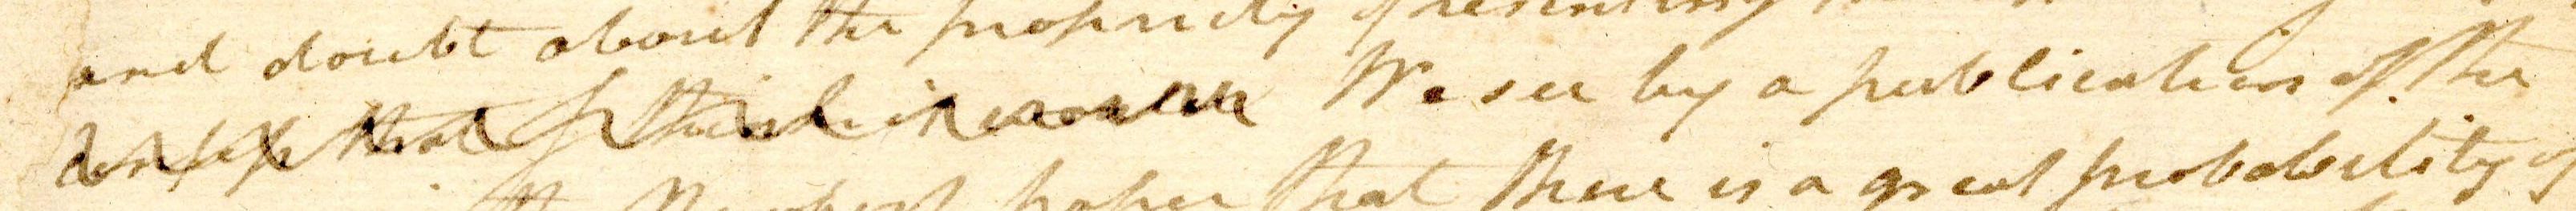[_________________] We are by a publication of the
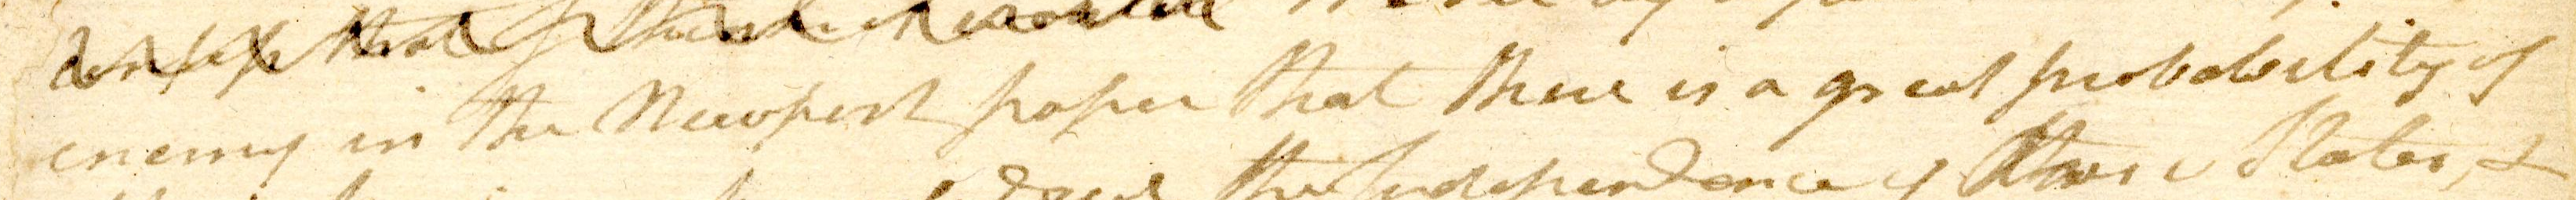enemy in the Newport paper that there is a great probability of
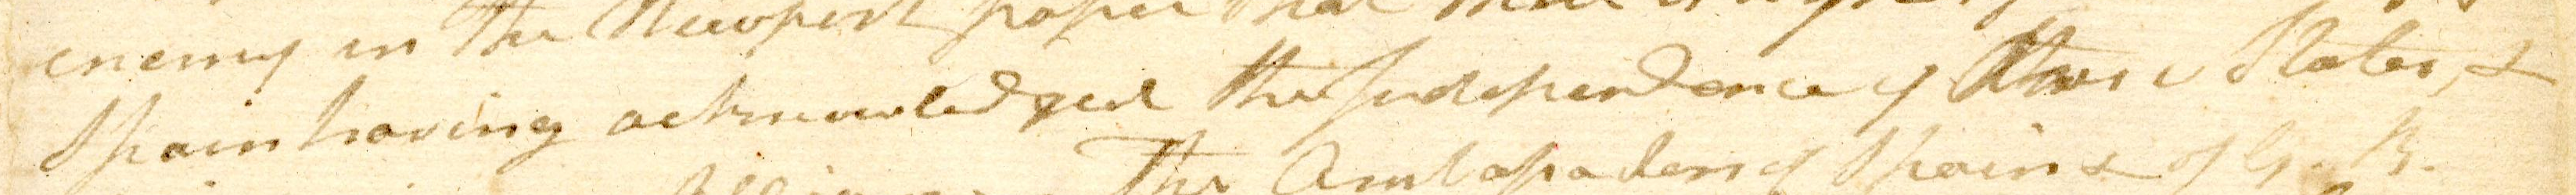Spain having acknowledged that the Independence of [these] States, &
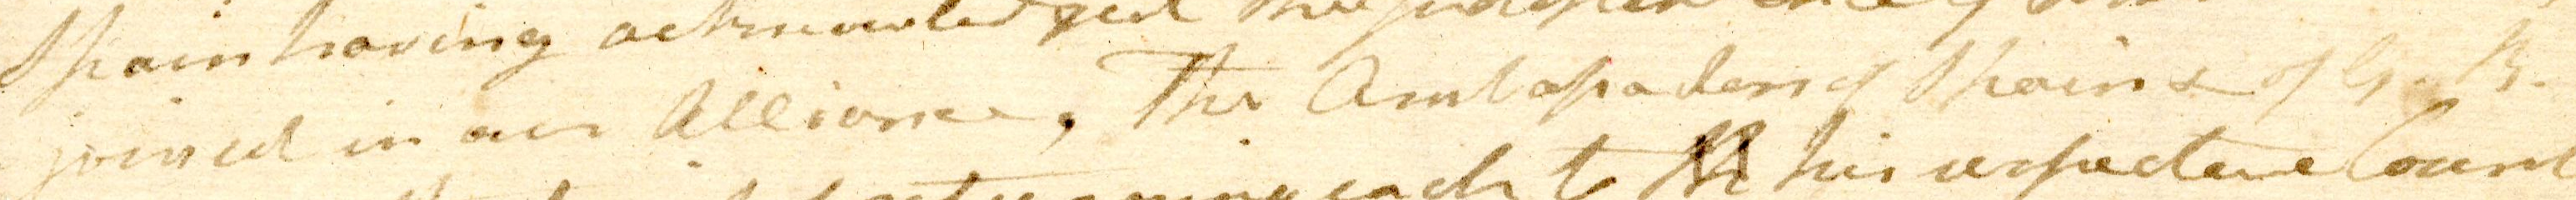joined in our Alliance, the Ambassadors of Spain & of G B
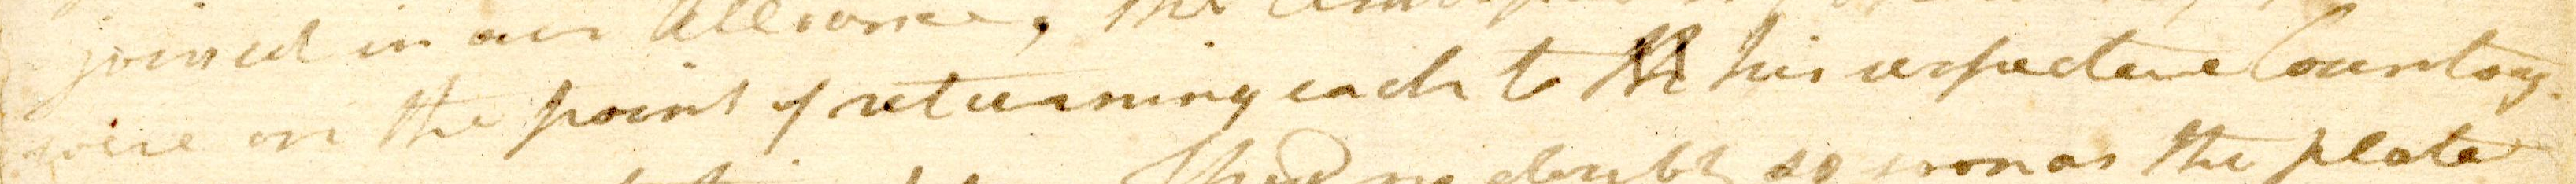were on the point of returning each to [__] his respective Country
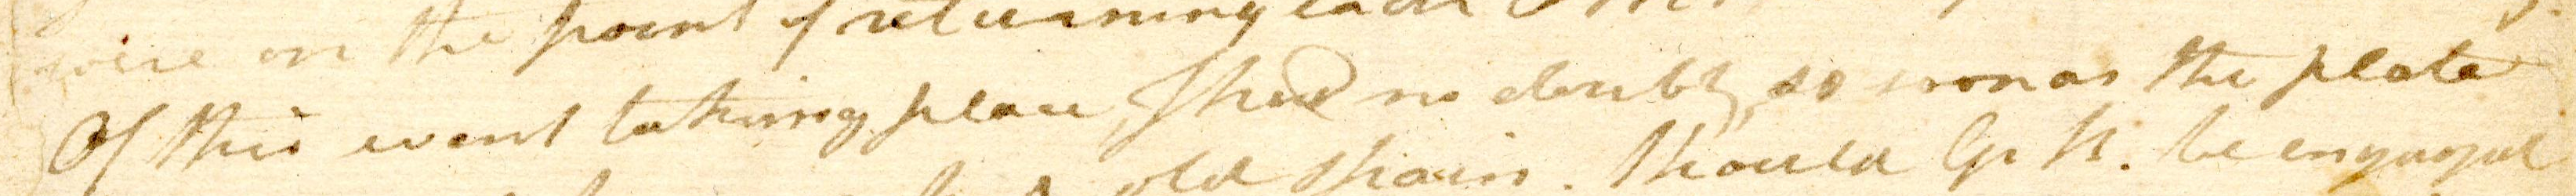Of this event taking place I had no doubt so soon as the plate
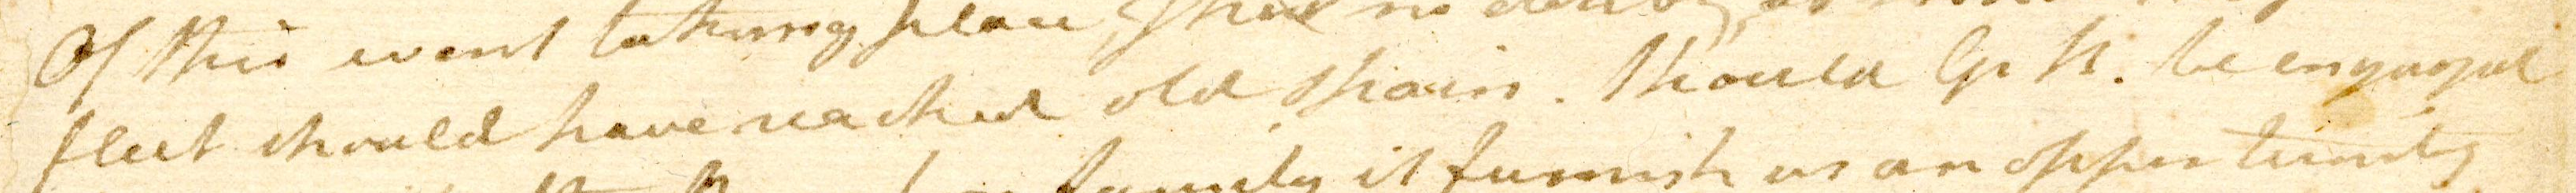fleet should have reached old Spain. Should G B. be engaged
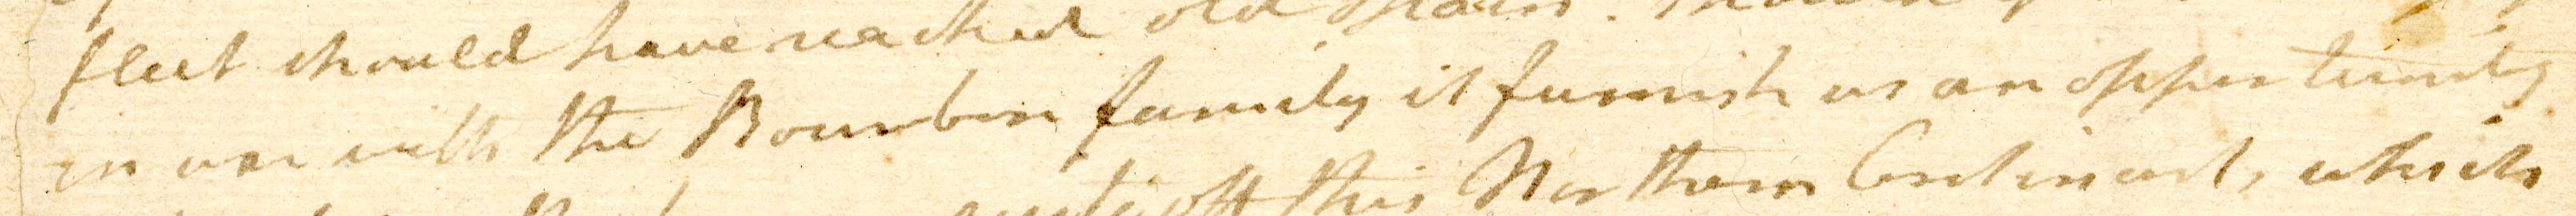in war with the Bourbon family it furnish us an opportunity
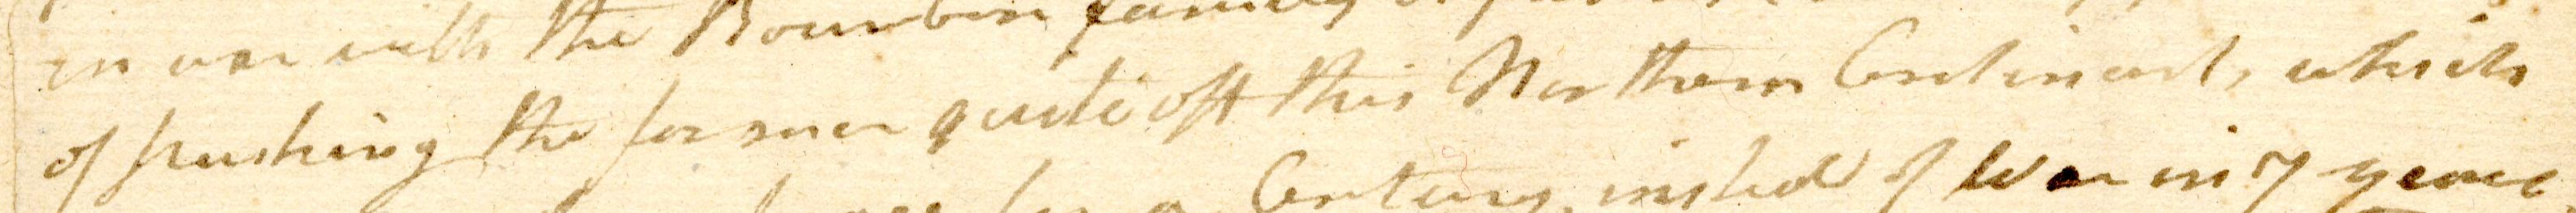of pushing the former quite off this Northern Continent, which
